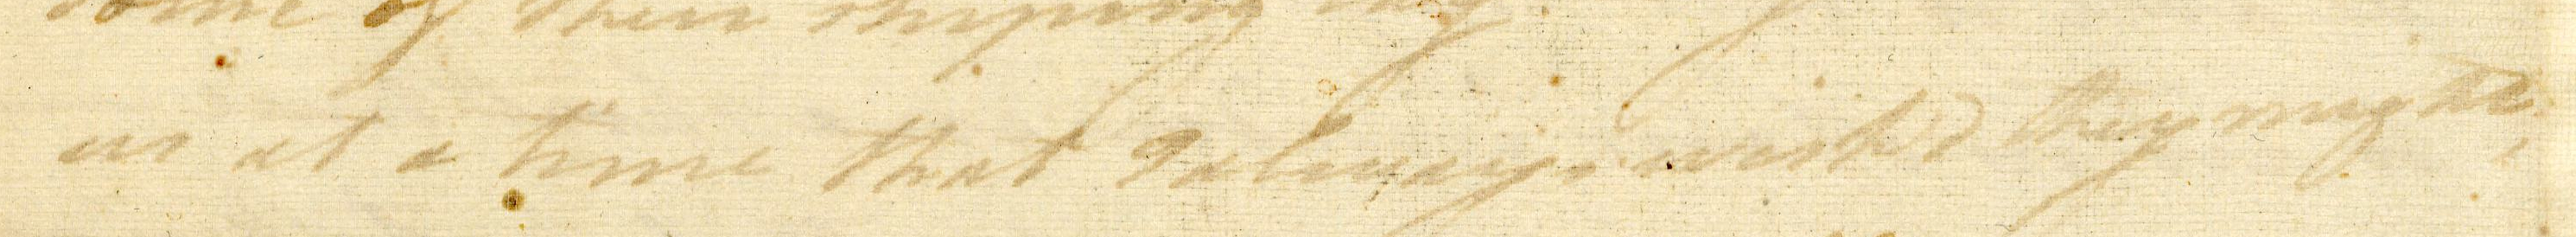us at a time that I always wish'd they might,
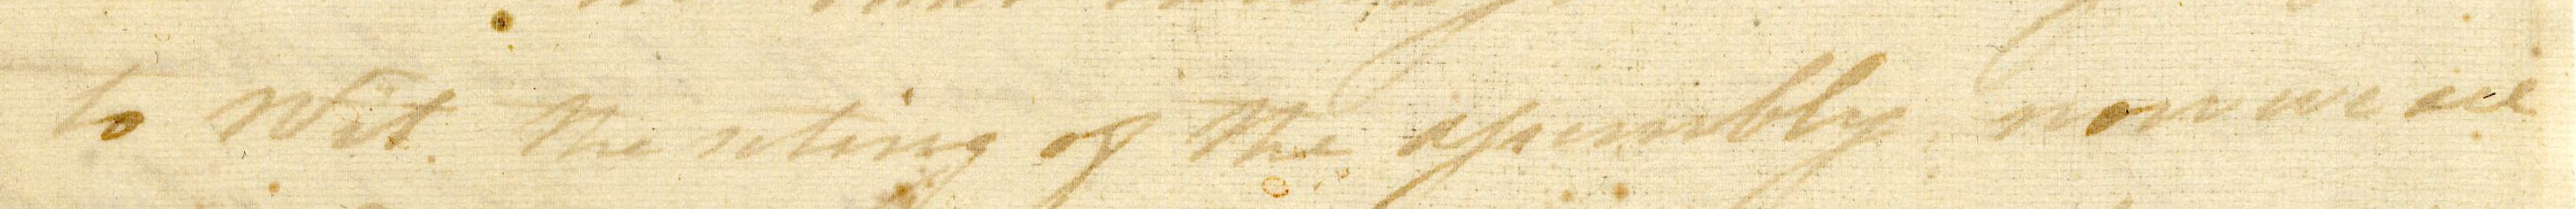to Wit. the sitting of the assembly now we are
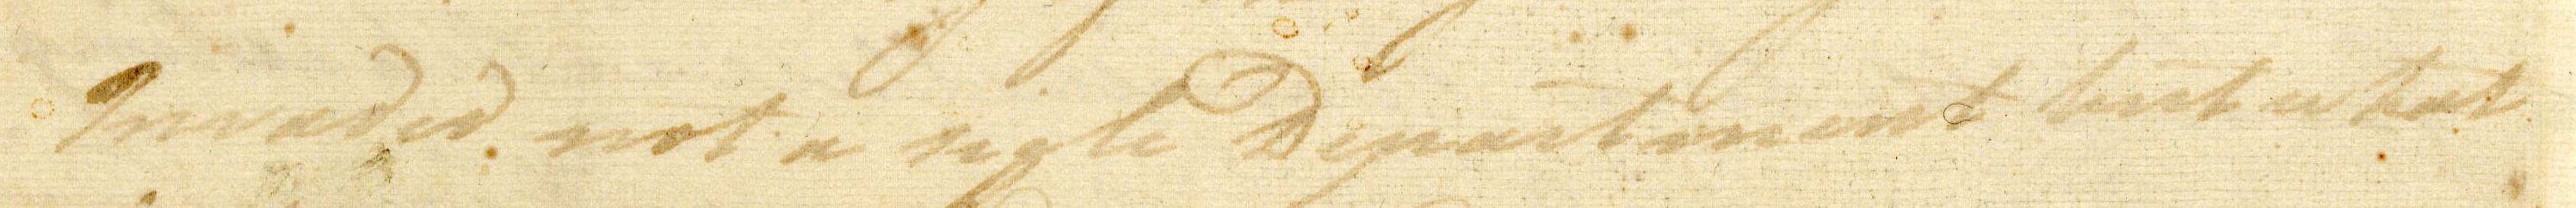Invaded, not a sigle Department but what
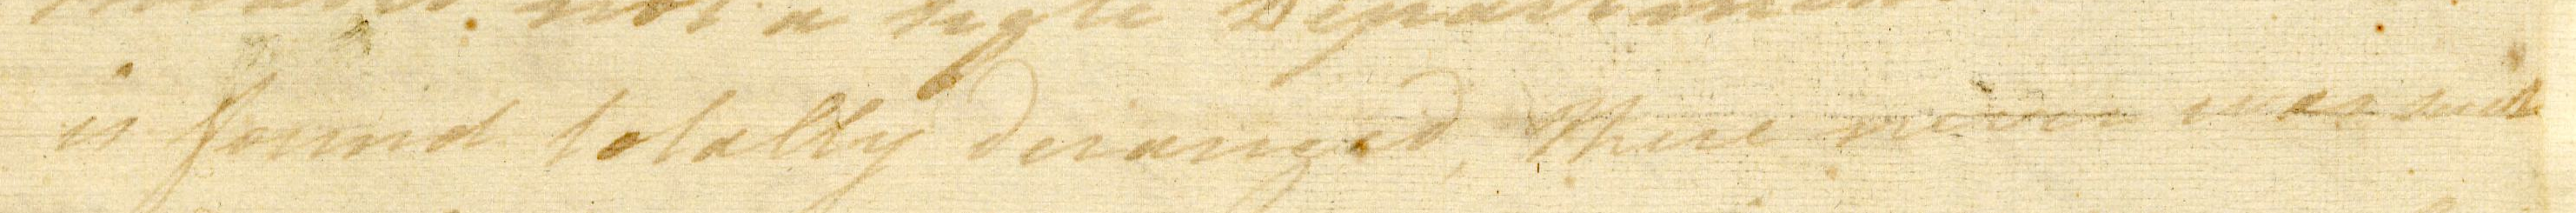is found totally deranged, there never was such
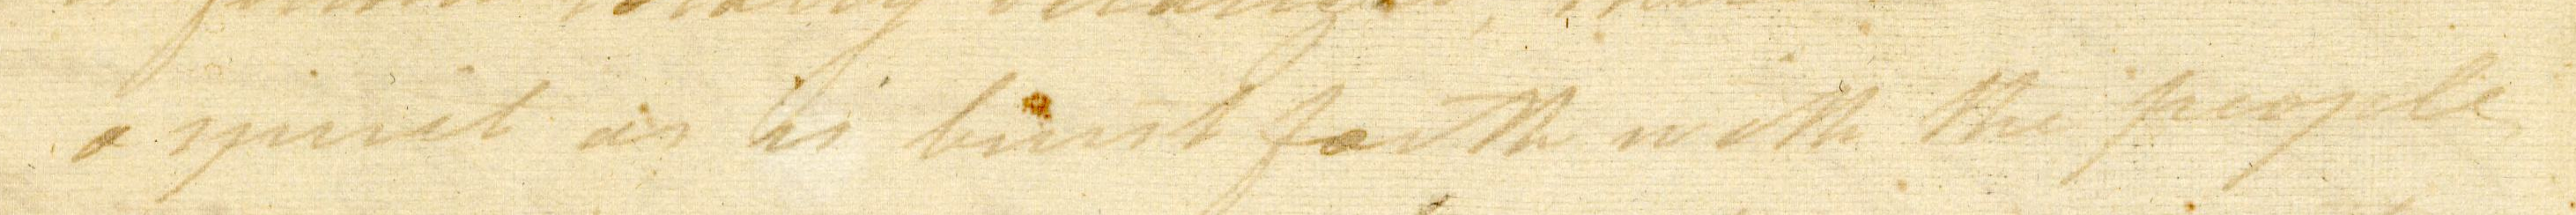a spirit as is burst forth with the people
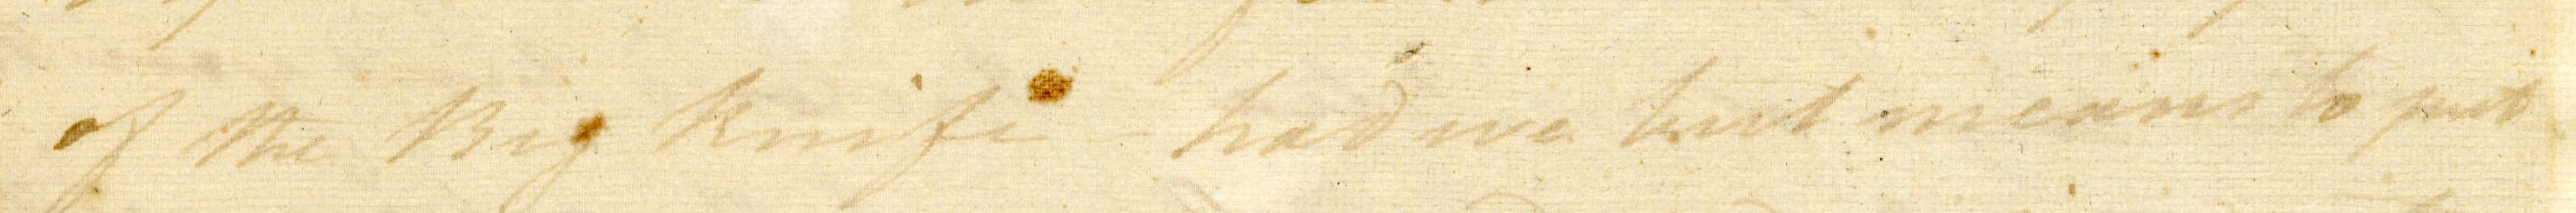of the Big Knife. had we but means to put
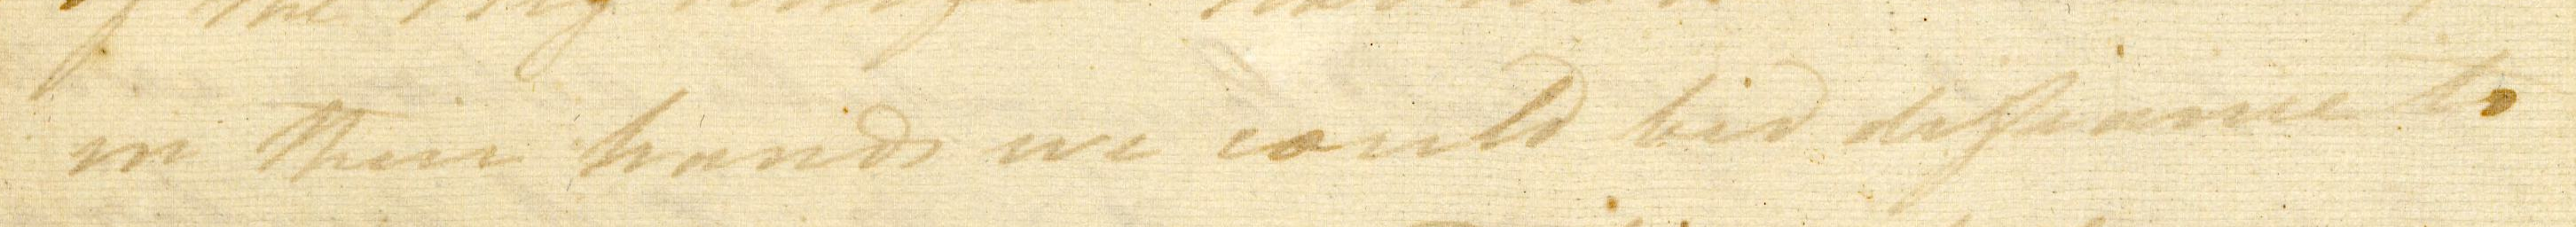in their hands we could bid defiance to
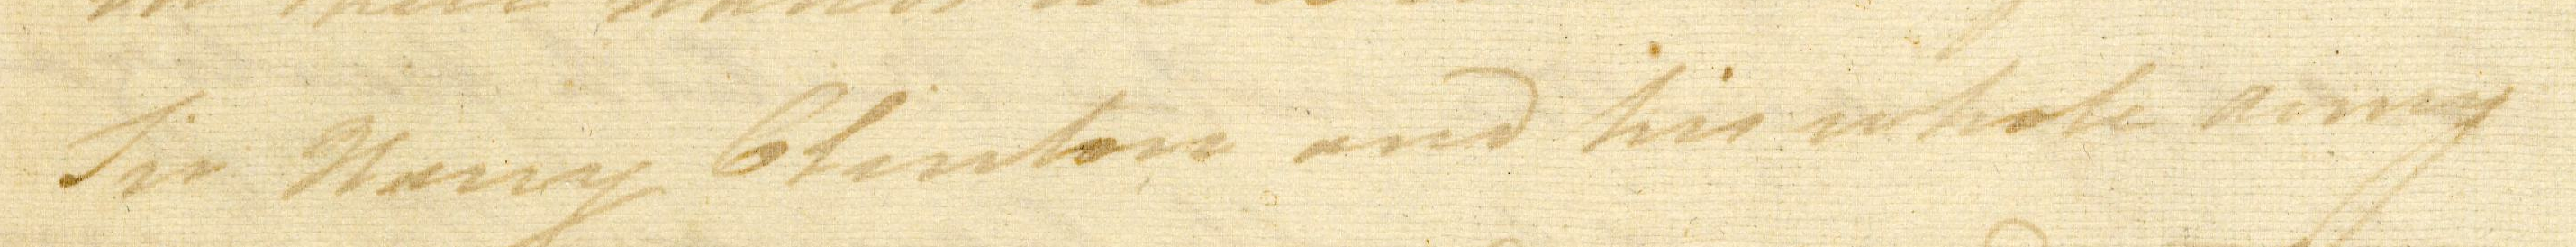Sir Henry Clinton and his whole army
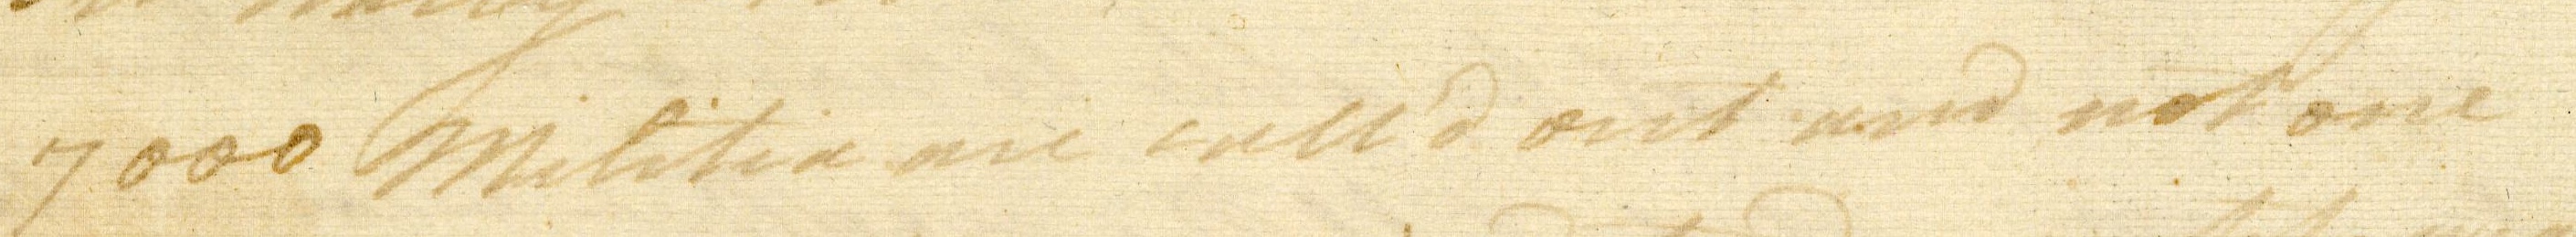7000 Militia are call'd out and not one
